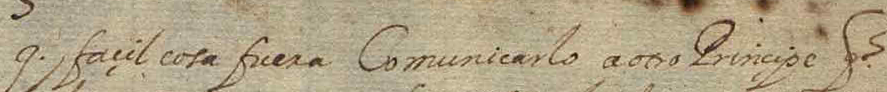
q̄ facil cosa fuera Comunicarlo a otro Principe q̄
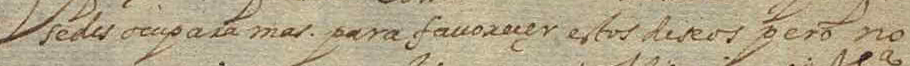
se desocupara mas para fauorecer estos deseos pero no
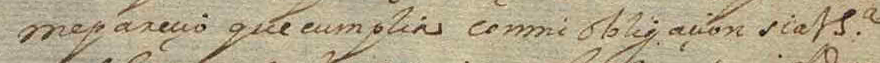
me pareció que cumplia con mi obligacion si a V S.a
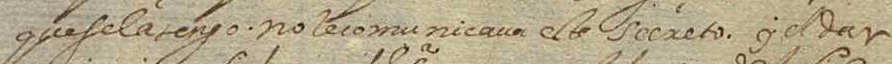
que se la tengo no le comunicaua este secreto. y el dar
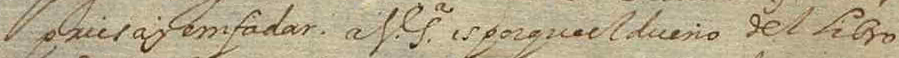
pues ay emfadar. a V. S.a es porque el dueno del libro
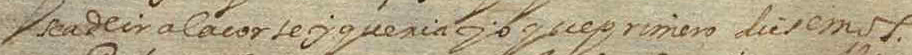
se a de ir a la corte y queria yo que primero diesemos
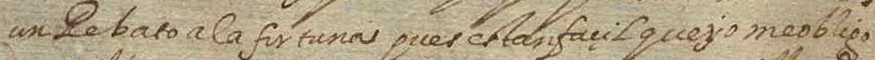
un Rebato a la fortuna pues es tan facil que yo me obligo
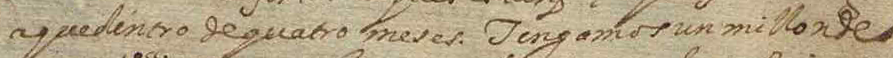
a que dentro de quatro meses Tengamos un millon de
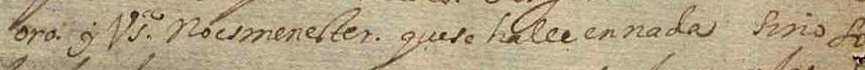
oro y V s.a no es menester que halce en nada sino so
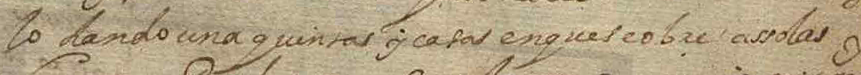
lo dando una quinta y casa en que se obre as solas y
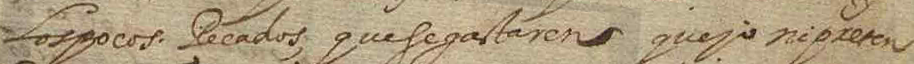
Los pocos. Recados, que se gastaren que jo ne preten
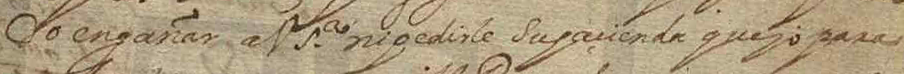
do engañar a V S.a ni pedirle su hacienda que jo para
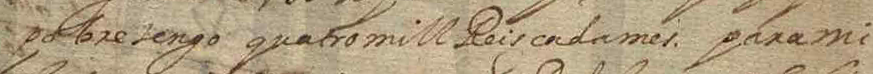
pobre tengo quatro mill Reis cada mes. para mi
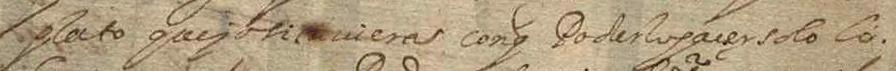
plato que jo si tuuiera con q̄ Poder lo hacer solo lo
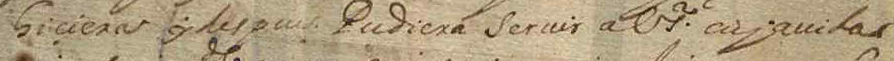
hiciera y despues Pudiera seruir a V s.a cuja uida
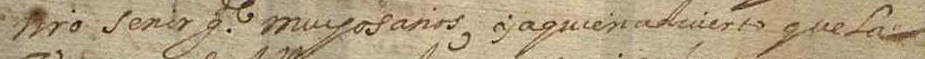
nro senor g.de muchos anos, y a quien aduierto que la
